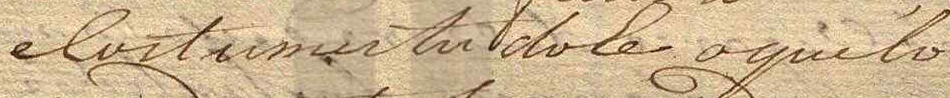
e Costumes tudo he o que lo
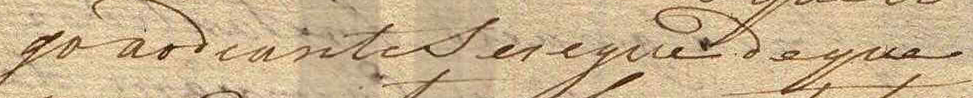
go aodeante Sesegue de que
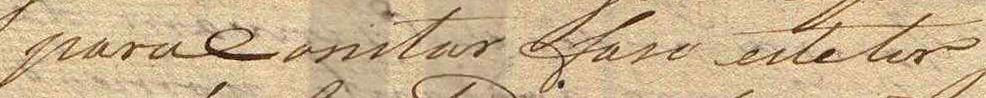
para Constar faso este ter
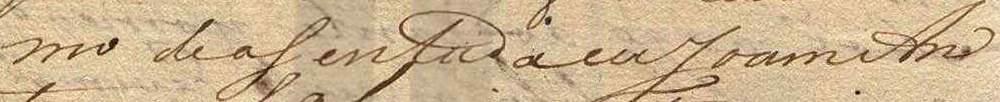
mo de asentada eu Joam An
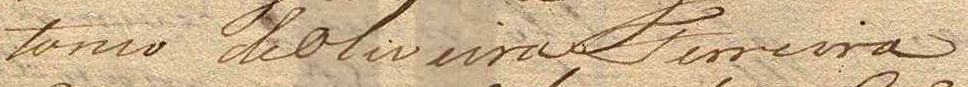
tonio de Oliveira Ferreira
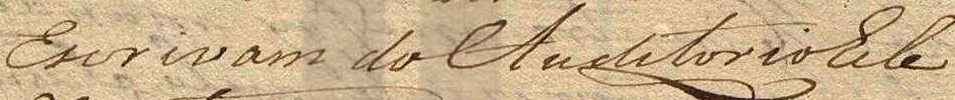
Escrivam do Auditorio Ecle
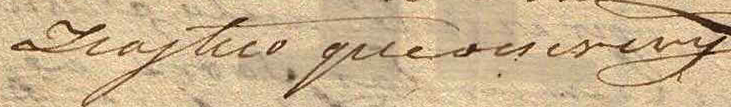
ziastico que o escrevy
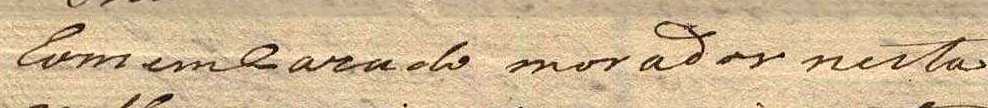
Homem Cazado morador nesta
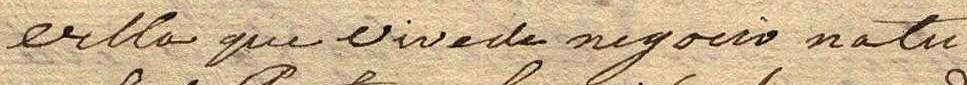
villa que vive de negocio natu
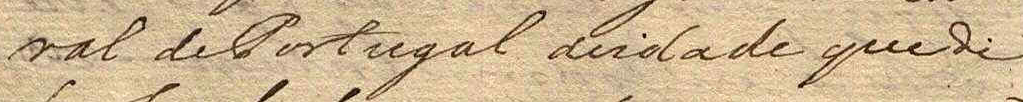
ral de Portugal de idade que di
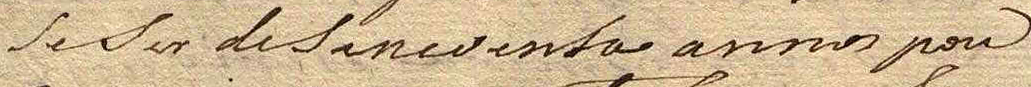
se Ser de Sancoenta annos pou
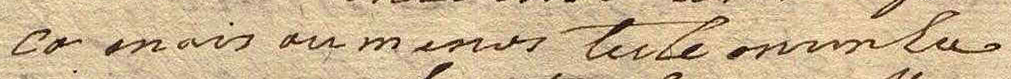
co mais ou menos testemunha
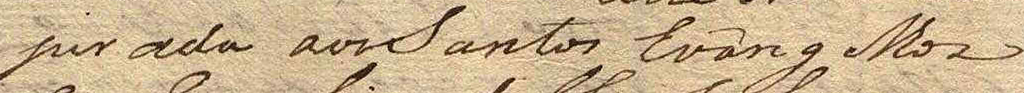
jurada aos Santos Evangelhos
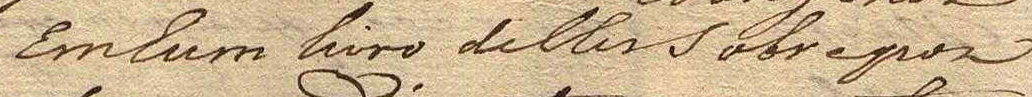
Em hum livro delles sobrepos
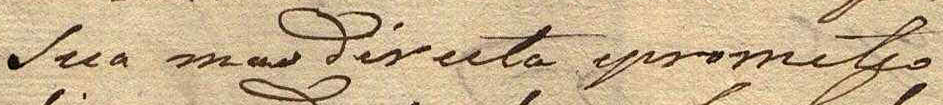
sua maõ direita e prometeo
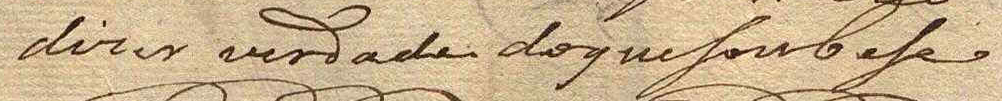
dizer verdade do que soubese
